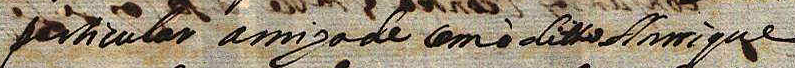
particular amizade com o ditto Anrrique
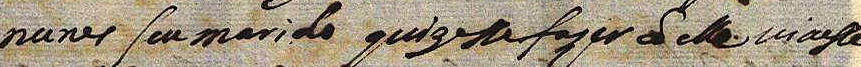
nunes seu marido quizesse fazer cō elle uiuesse
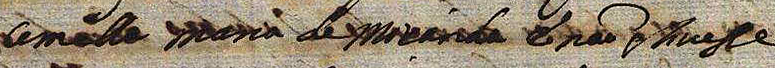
com ella maria de miranda e naõ estiuesse
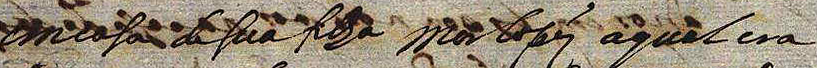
em casa de sua filha ma lopez̄ a qual era
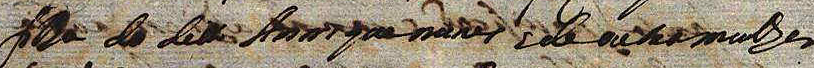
filha do ditto Anrrique nunes E de outra mulher
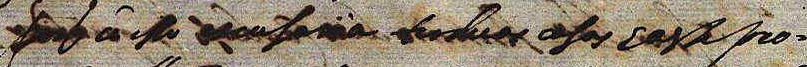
porq̄ cō isso escusaria ter duas casas E este pro
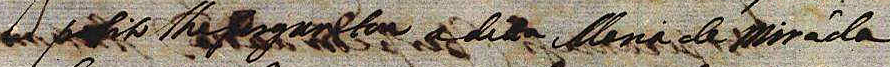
posito lhe perguntou a ditta Maria de mirāda
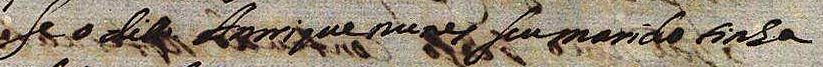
se o ditto Anrrique nunes seu marido tinha
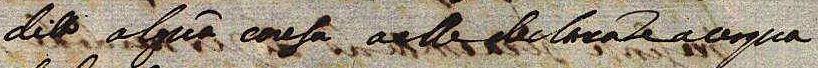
ditto alguā cousa a elle declarāte acerqua
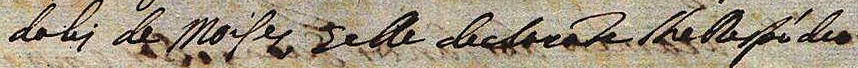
da lej de Moises E elle declarāte lhe Respōdeo
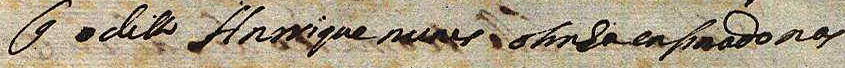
q̄ o ditto Anrrique nunes o tinha ensinado nas
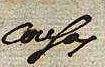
cousas
